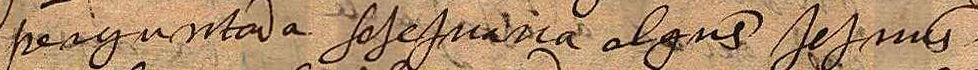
perguntada se JeJuaua algūs JeJūs
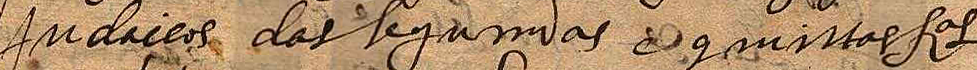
Judaicos das segumdas e quintas fras
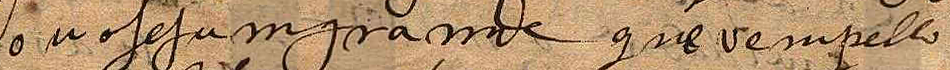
ou o JeJum grande que vem pello
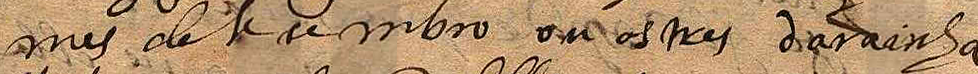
mes de setembro ou os tres da rainha
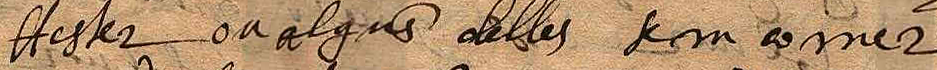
Hester ou algūs delles sem comer
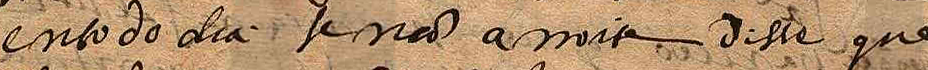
en todo dia senão a noite disse que
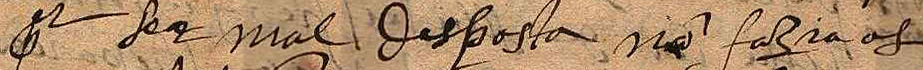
p̄or ser mal desposta nā fazia os
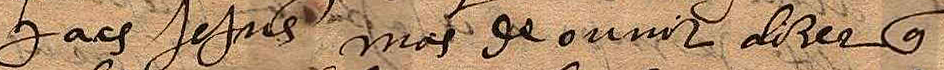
taes JeJūs mas de ouuir dizer q̄
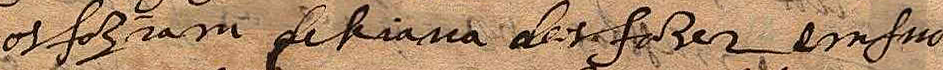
os faziam deseiaua de os fazer em sua
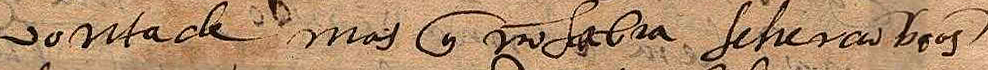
vontade mas q̄ nō sabia se heraõ boōs
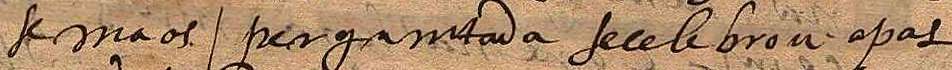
se maos / pergumtada se celebrou a pas
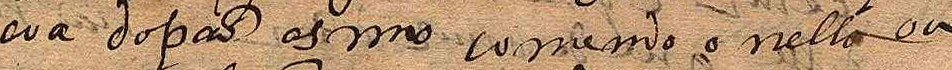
coa do paõ asmo comendo o nella ou
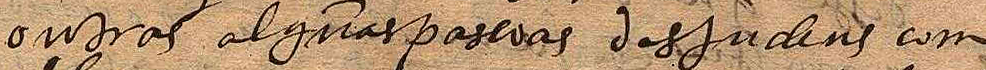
outras algūas pascoas dos Judeus com
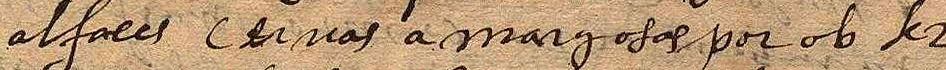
alfaces e eruas amargosas por obser
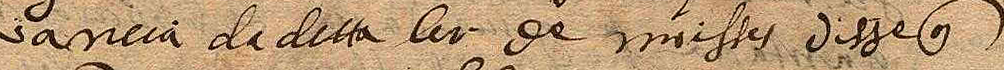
vancia da ditta lei de moisses disse q̄
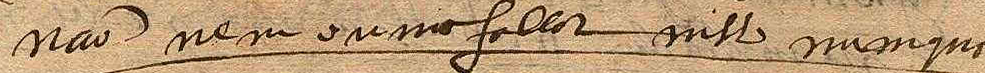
naõ nem ouuio fallar nisso numqua
